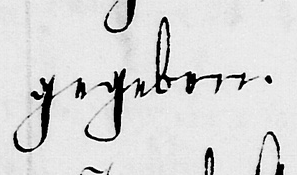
gegeben.
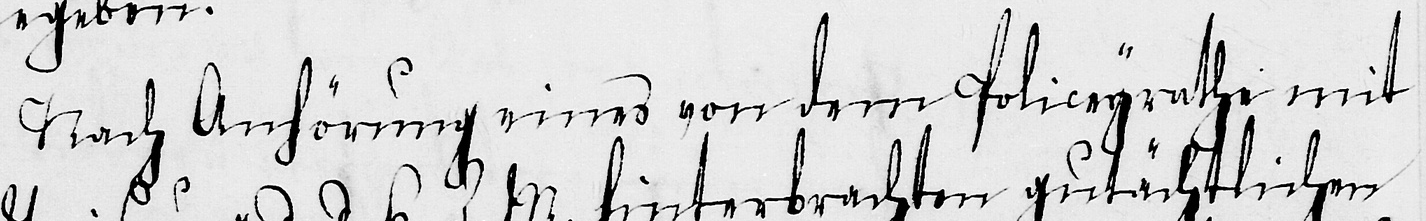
Nach Anhörung eines von dem Policeyrathe mit
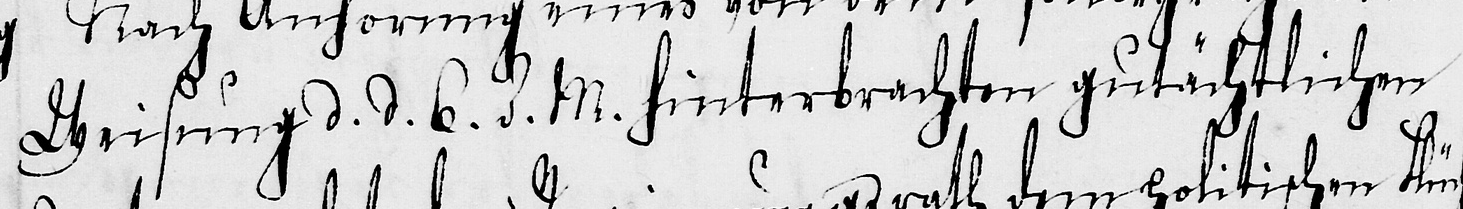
Weisung d. d. 6. d. M. hinterbrachten gutächtlichen
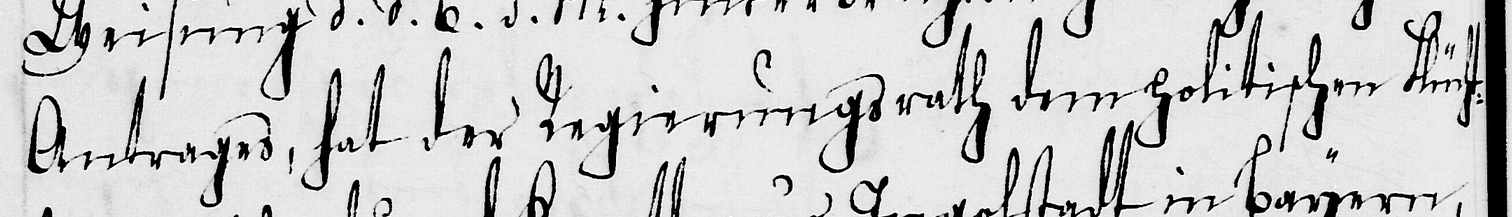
Antrages, hat der Regierungsrath dem politischen Flüc¬
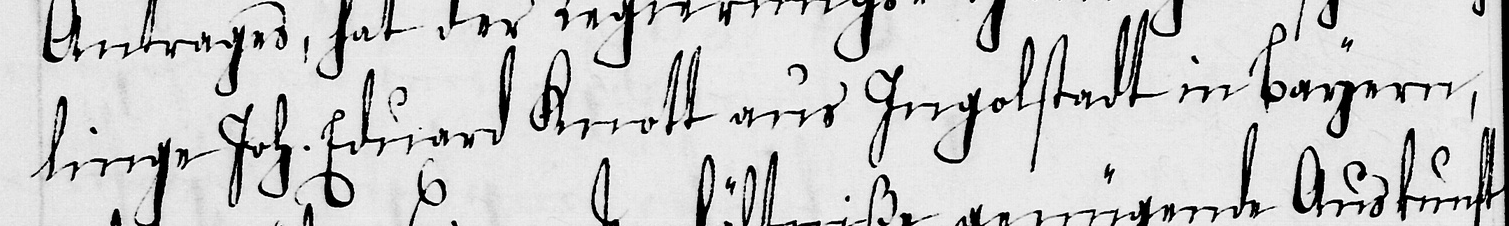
linge Joh. Eduard Knott aus Ingolstadt in Bayern,
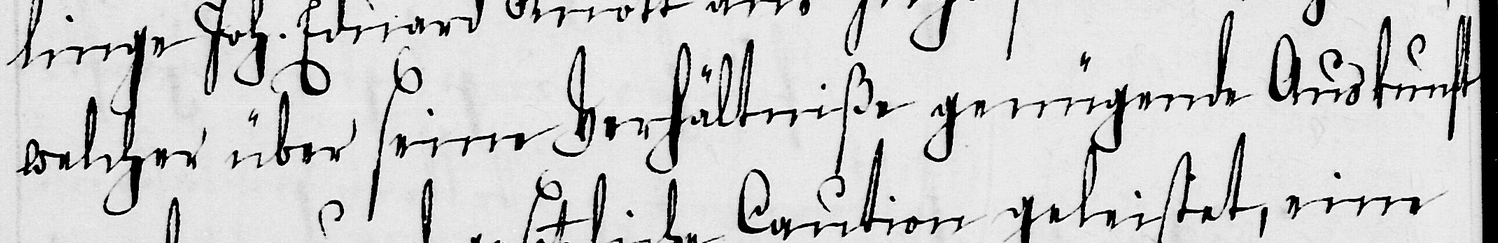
welcher über seine Verhältniße genügende Auskunft
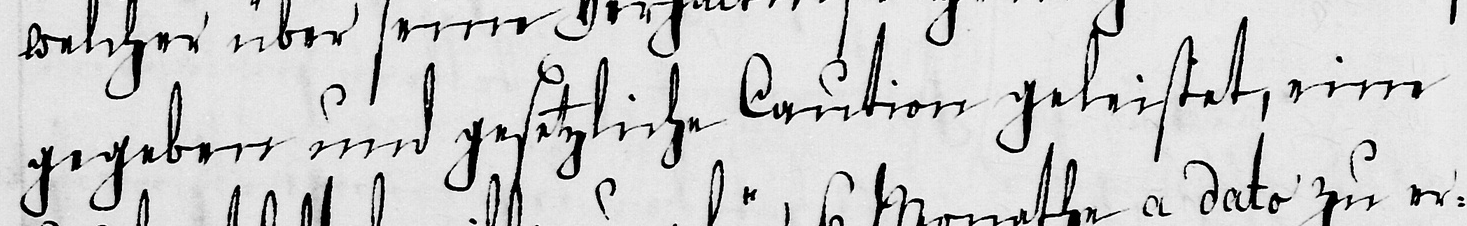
gegeben und gesetzliche Caution geleistet, eine
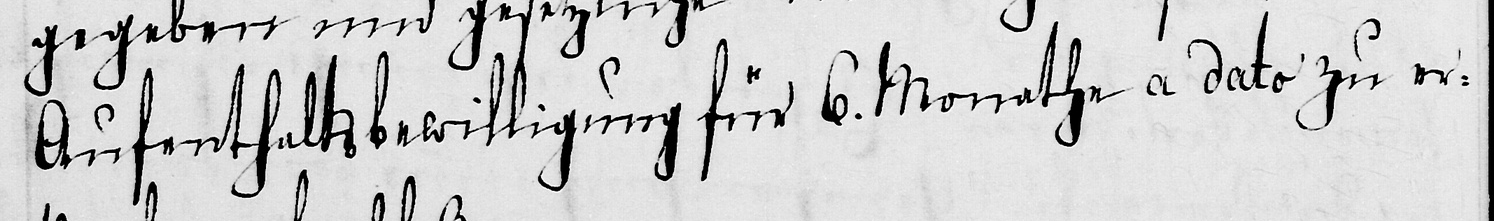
Aufenthaltsbewilligung für 6. Monathe a dato zu er¬
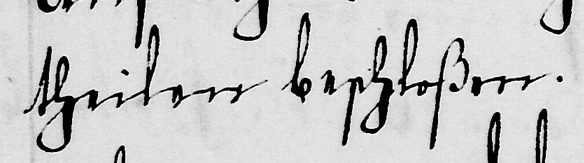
theilen beschloßen.
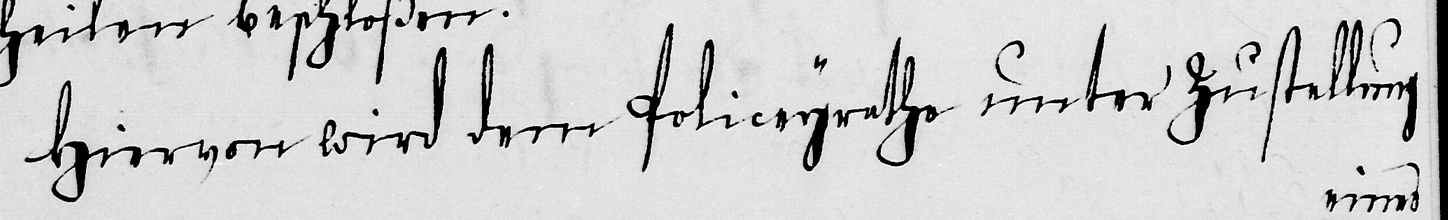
Hiervon wird dem Policeyrathe unter Zustellung
